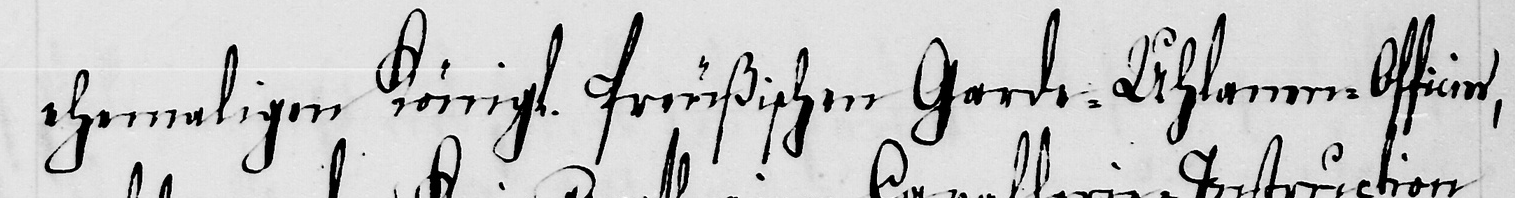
ehemaligen Königl. Preußischen Garde-Uhlanen-Offic¬
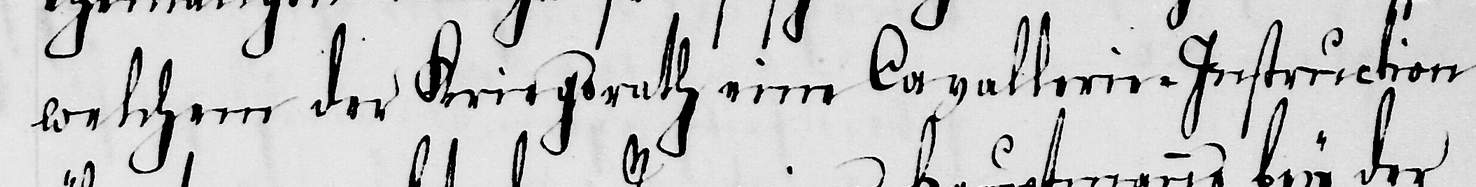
welchem der Kriegsrath eine Cavallerie-Instruction
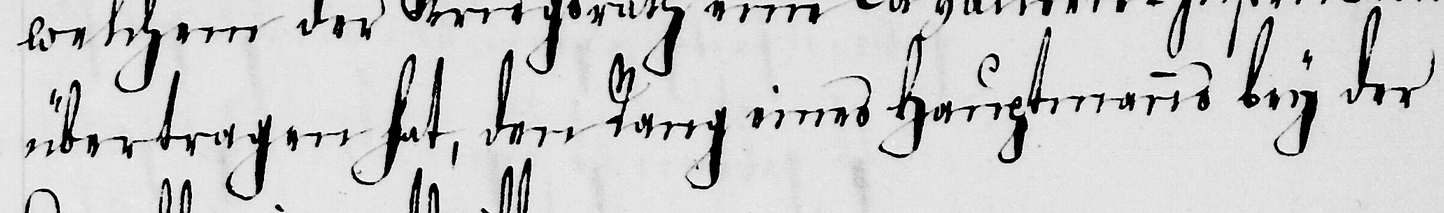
übertragen hat, den Rang eines Hauptmanns bey der
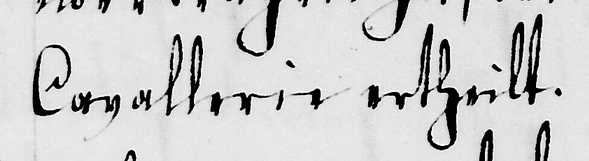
Cavallerie ertheilt.
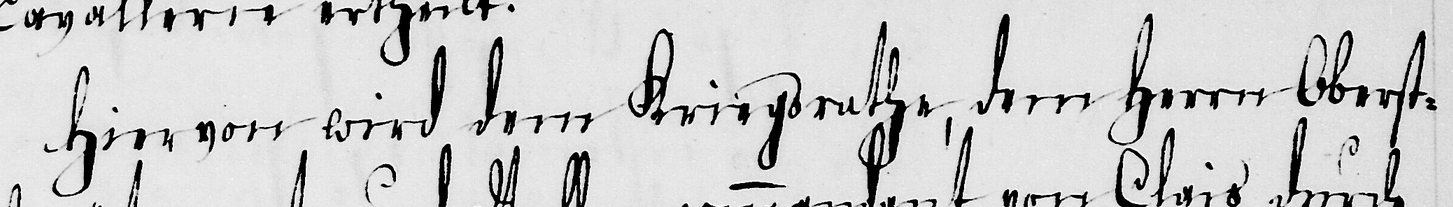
Hiervon wird dem Kriegsrathe, dem Herrn Oberst¬
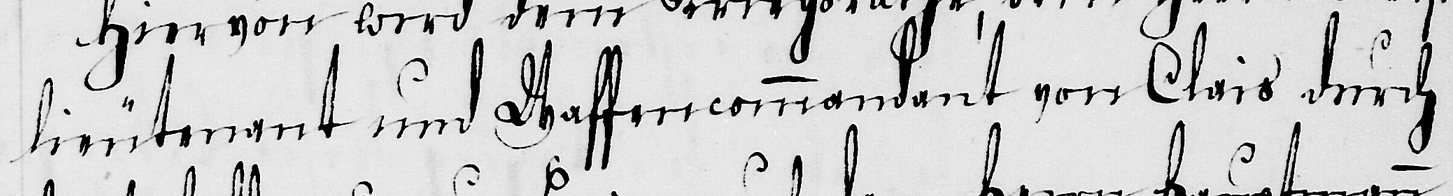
lieutenant und Waffencommandant von Clais durch
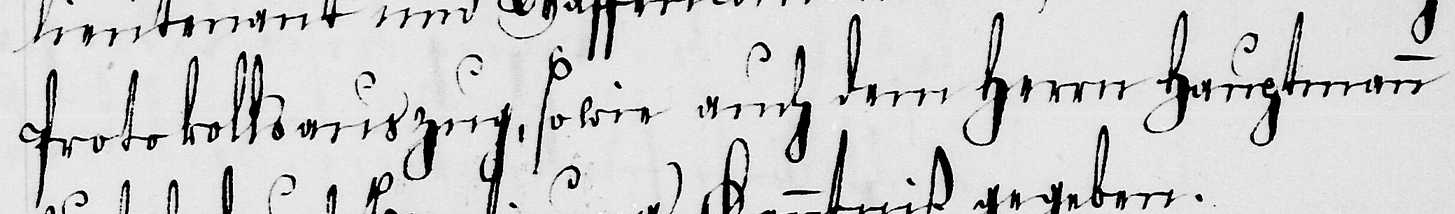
Protokollsauszug, sowie auch dem Herrn Hauptmann
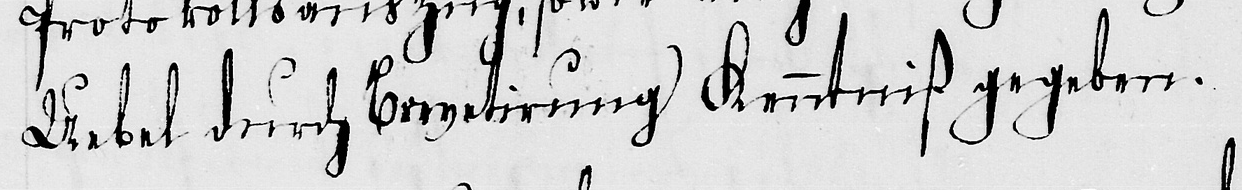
Uebel durch Brevetirung Kenntniß gegeben.
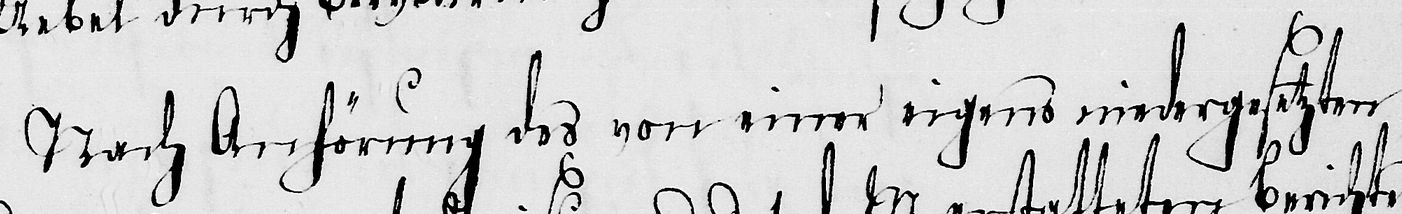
Nach Anhörung des von einer eigens niedergesetzten
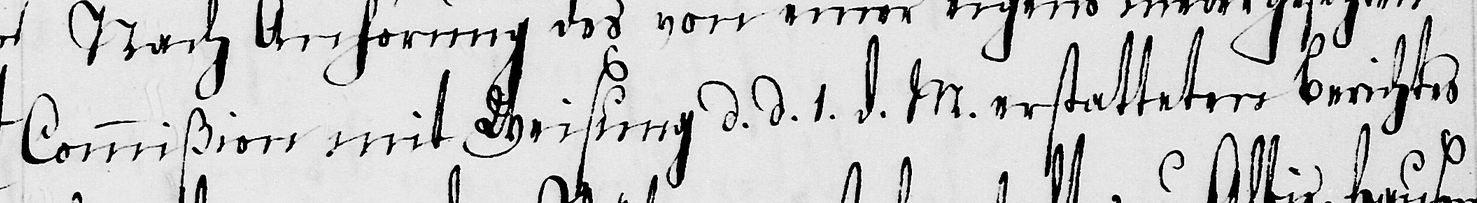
Commißion mit Weisung d. d. 1. d. M. erstatteten Berichtes
